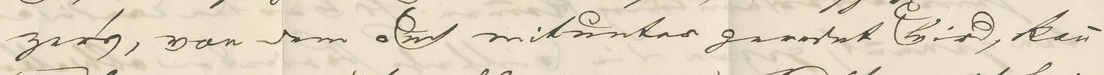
zer's, von dem auch mitunter geredet wird, kann
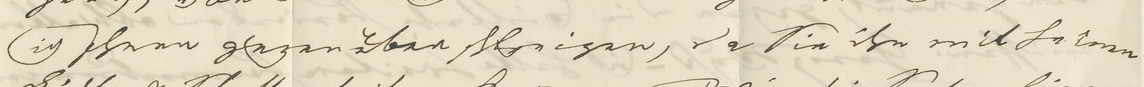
ich Ihnen gegenüber schweigen, da Sie ihn mit seinen
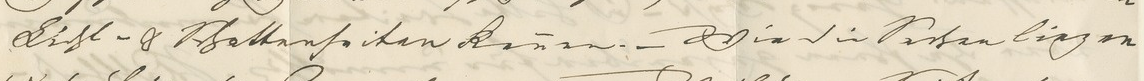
Licht- & Schattenseiten kennen. – Wie die Sachen liegen
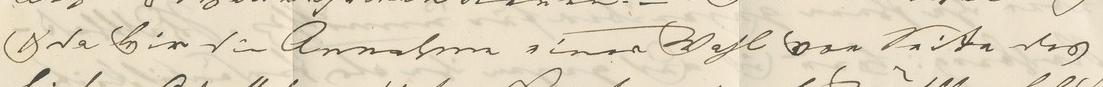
& da wir die Annahme einer Wahl von Seite des
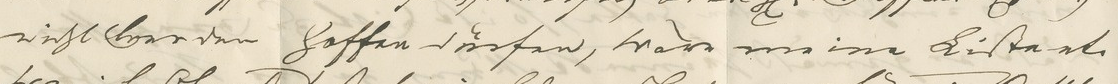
nicht werden hoffen dürfen, wäre meine Liste et-
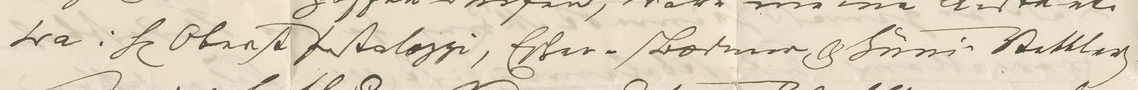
wa: Herr Oberst Pestalozzi, Escher-Bodmer & Hüni-Stettler.
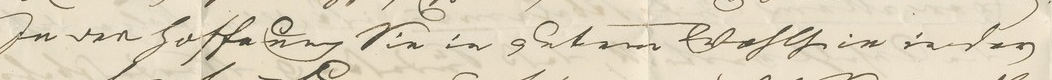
In der Hoffnung Sie in gutem Wohlsein in der
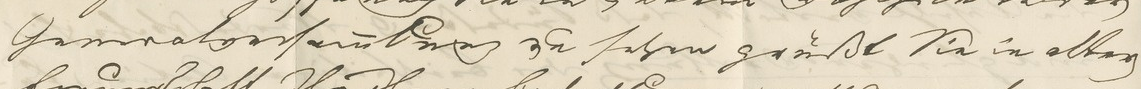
Generalversammlung zu sehen grüßt Sie in alter
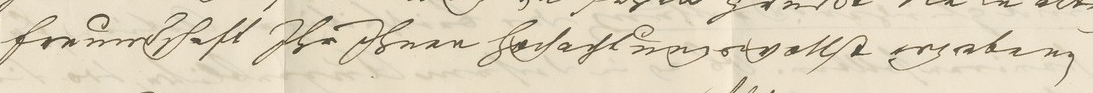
Freundschaft Ihr Ihnen hochachtungsvollst ergebener
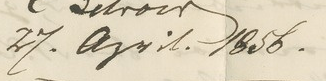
27. April. 1856.
